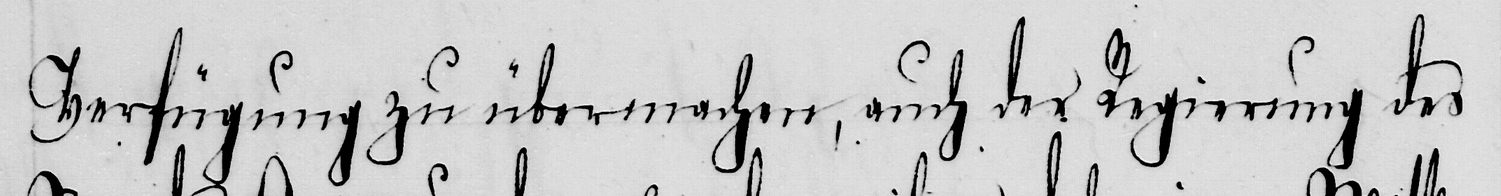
Verfügung zu übermachen, auch der Regierung des
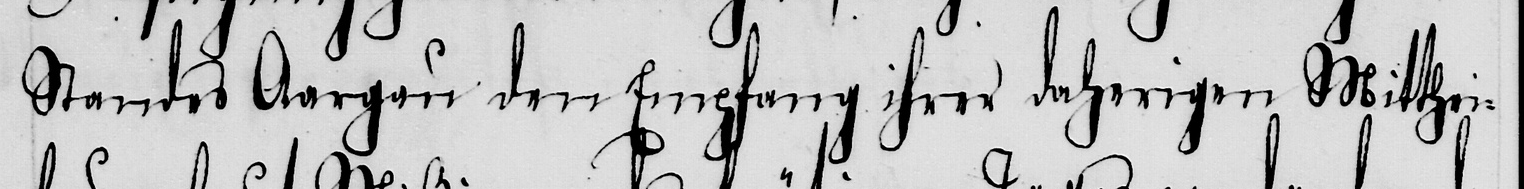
Standes Aargau den Empfang ihrer daherigen Mitthei¬
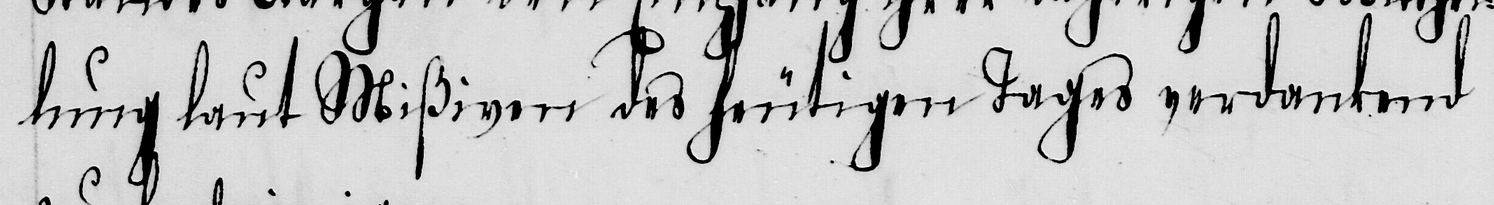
lung laut Mißiven des heutigen Tages verdankend
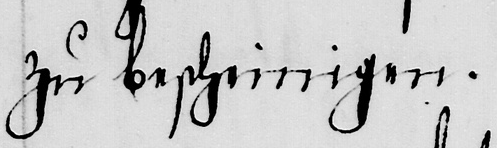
zu bescheinigen.
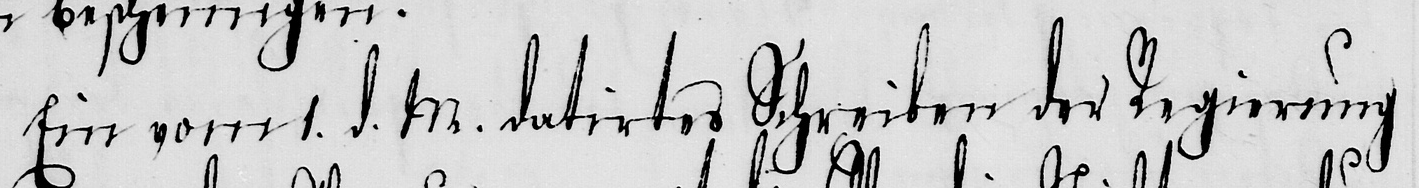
Ein vom 1. d. M. datirtes Schreiben der Regierung
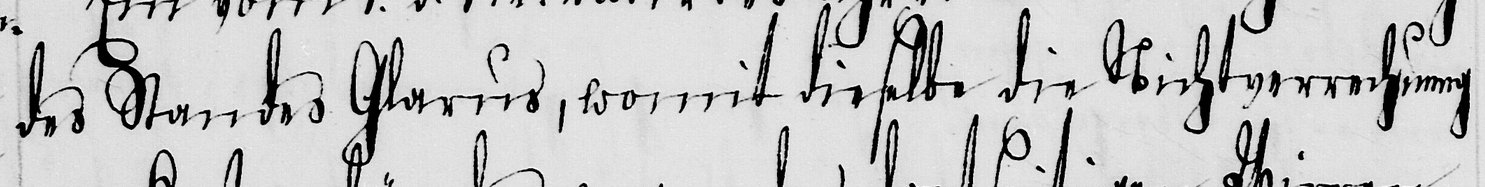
des Standes Glarus, womit dieselbe die Nichtverrechnung
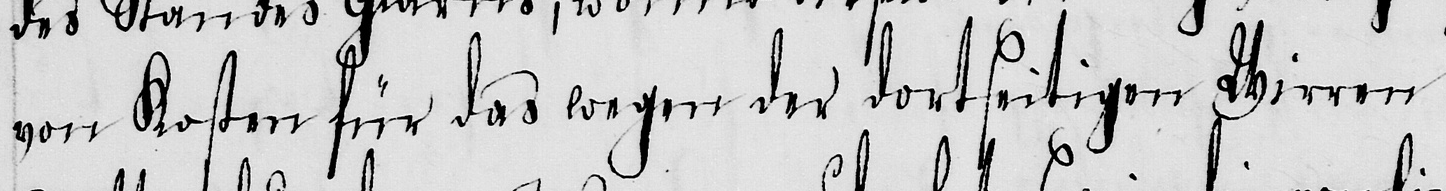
von Kosten für das wegen der dortseitigen Wirren
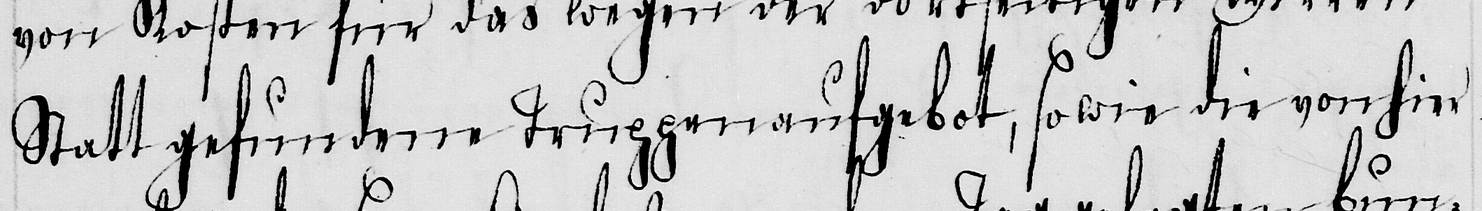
Statt gefundene Truppenaufgebot, sowie die von hi¬
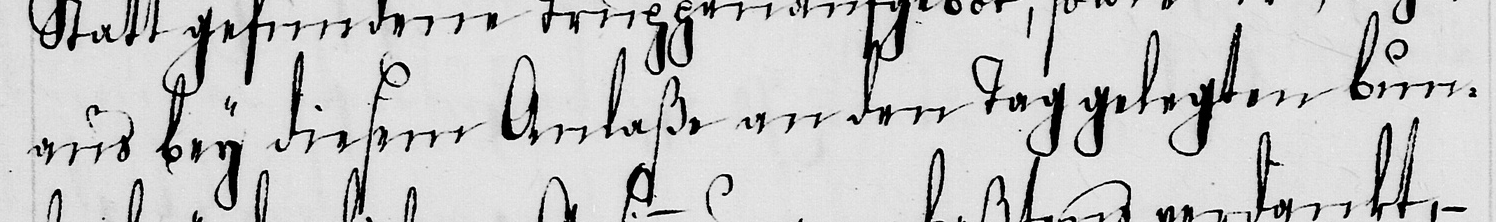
aus bey diesem Anlaße an den Tag gelegten Bun¬
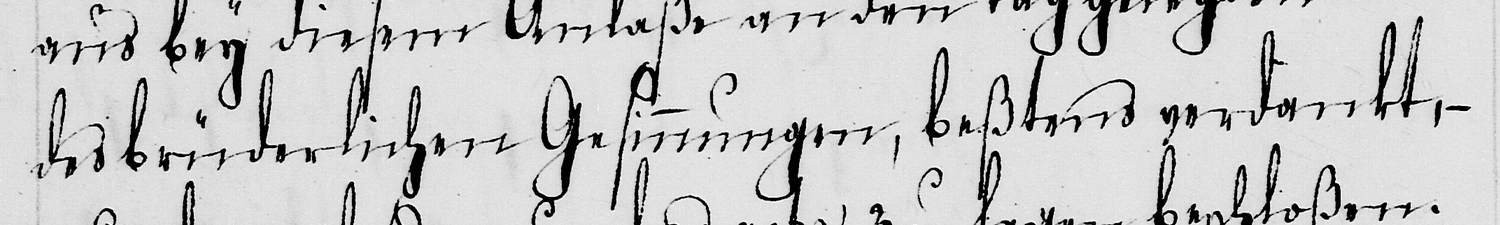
desbrüderlichen Gesinnungen, beßtens verdankt, –
